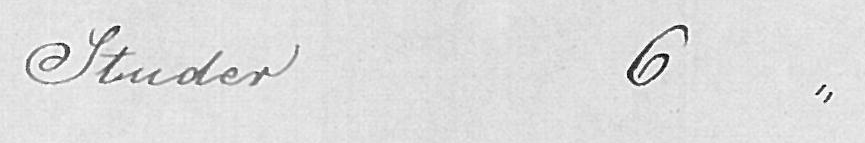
Studer 6 "
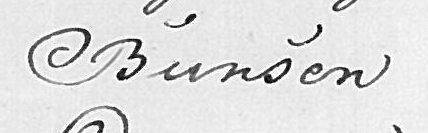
Bunsen
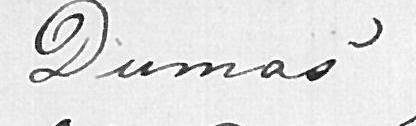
Dumas
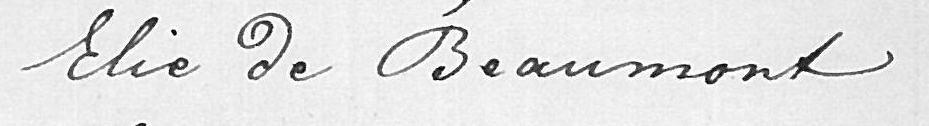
Elie de Beaumont
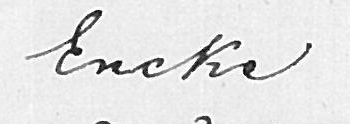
Encke
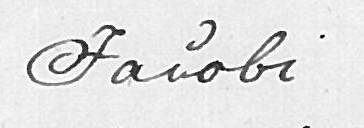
Jacobi
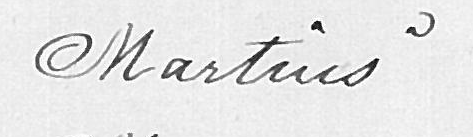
Martius
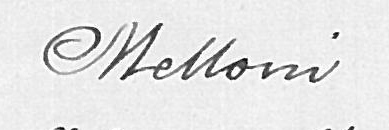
Melloni
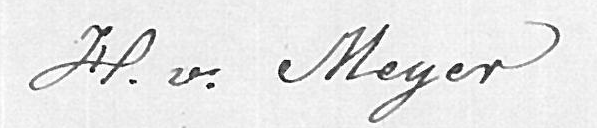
H. v. Meyer
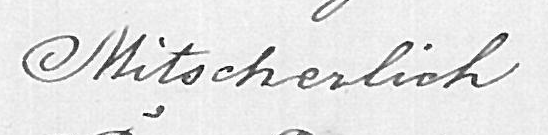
Mitscherlich
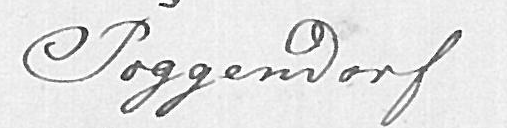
Poggendorf
